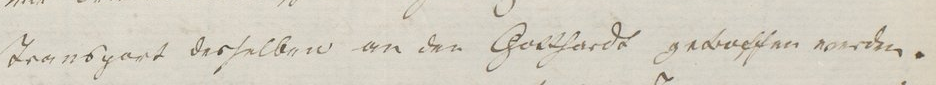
Transport desselben an den Gotthardt getroffen werden.
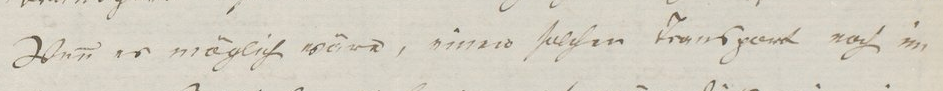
Wenn es möglich wäre, einen solchen Transport noch im
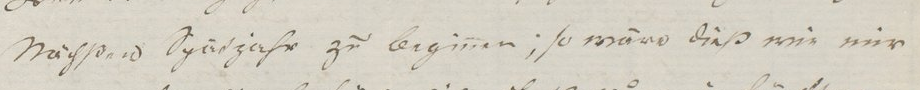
Nächsten Späthjahr zu beginnen; so wäre dieß wie mir
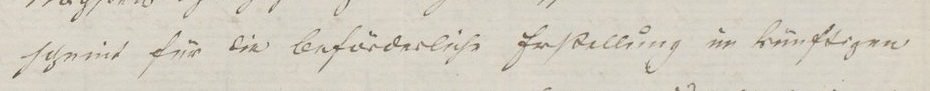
scheint für die beförderliche Erstellung im künftigen
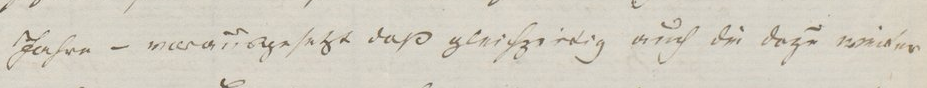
Jahre – vorausgesetzt daß gleichzeitig auch die dazu weiter
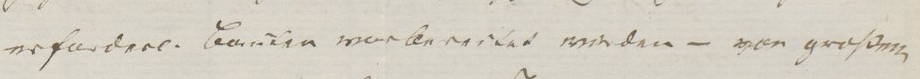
erforderl. Bauten vorbereitet werden – von großem
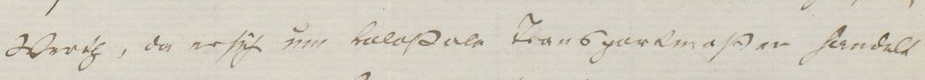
Werth, da es sich um koloßale Transportmaßen handelt
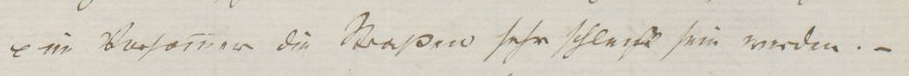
& im Vorsommer die Straßen sehr schlecht sein werden. –
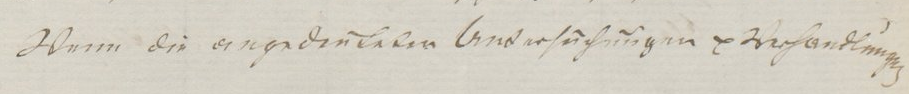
Wenn die angedeuteten Untersuchungen & Verhandlungen
